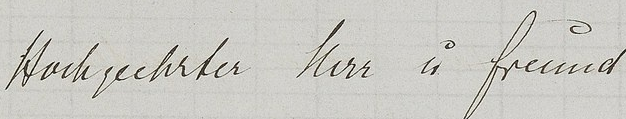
Hochgeehrter Herr u Freund
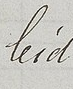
sehr
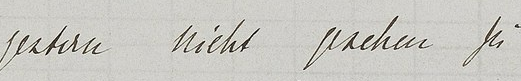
gestern nicht gesehen zu
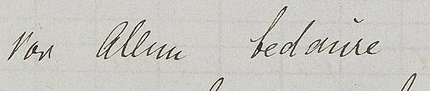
vor allem bedaure ich,
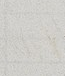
uns
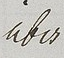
keine
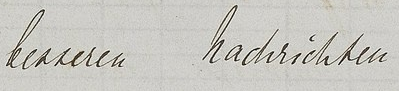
besseren Nachrichten
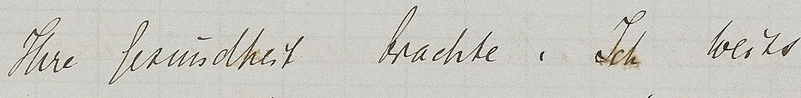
Ihre Gesundheit brachte. Ich weiss
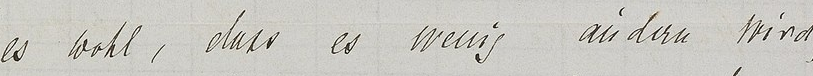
es wohl, dass es wenig ändern wird,
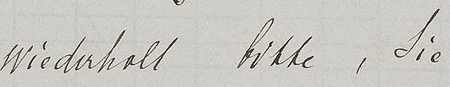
wiederholt bitte, Sie
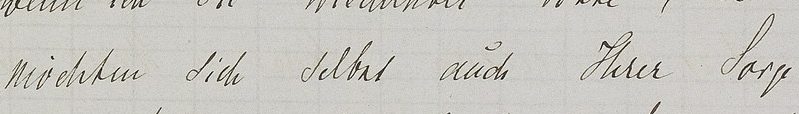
möchten sich selbst auch Ihrer Sorge
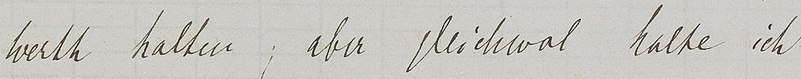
werth halten; aber gleichwol halte ich
